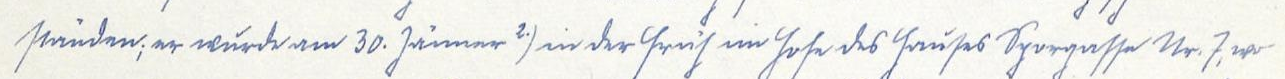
ständen; er wurde am 30. Jänner 2) in der Frühe im Hofe des Hauses Sporgasse 7, wo
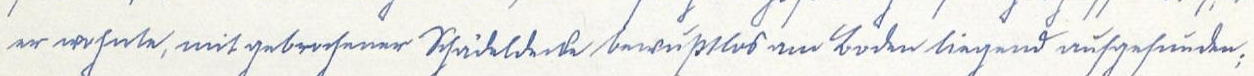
er wohnte, mit gebrochener Schädeldecke bewusstlos am Boden liegend aufgefunden;
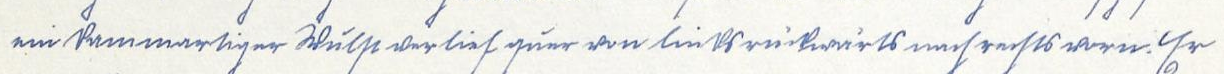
ein kammartiger Wulst verlief quer von links rückwärts nach rechts vorn. Er
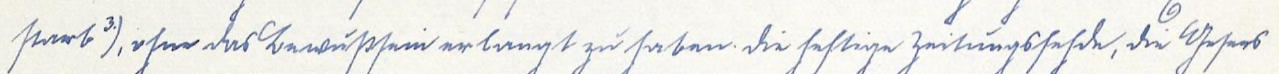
starb 3), ohne das Bewußtsein erlangt zu haben. Die heftige Zeitungsfede, die Gesers
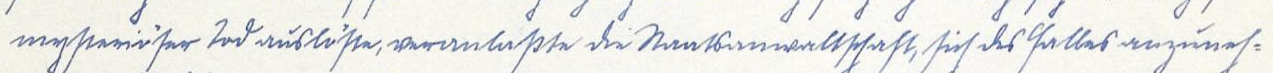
mysteriöser. Tod auslöste, veranlasste die Staatsanwaltschaft, sich des Falles anzuneh-
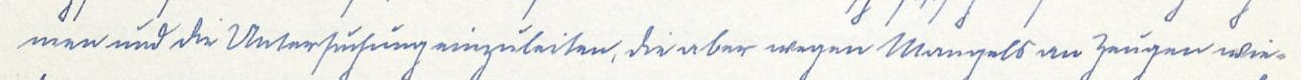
men und die Untersuchung einzuleiten, die aber wegen Mangels an Zeugen wie-
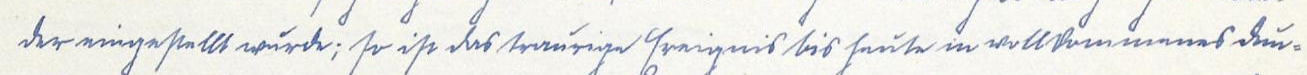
der eingestellt wurde; so ist das traurige Ereignis bis heute in vollkommenes Dun-
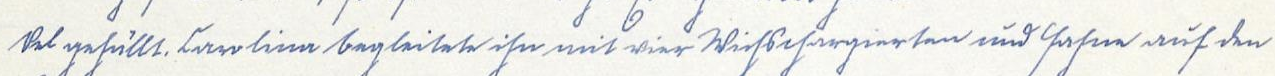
kel gehüllt. Carolina begleitete ihn mit vier Wichschargierten und Fahnen auf den
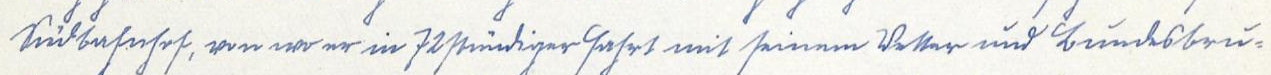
Südbahnhof, von wo er ihn 72stündiger Fahrt mit seinem Vetter und Bundesbru-
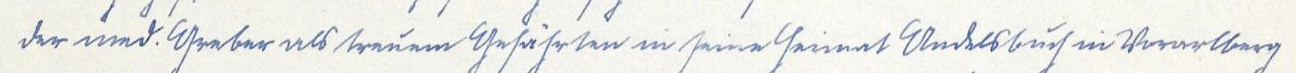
der Greber als treuem Gefährten in seiner Heimat Andelsbuch in Vorarlberg
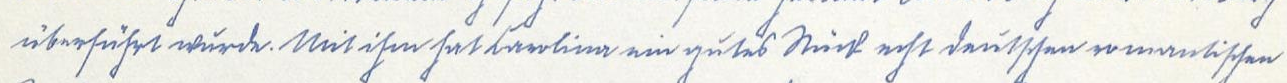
überführt wurde. Mit ihm hat Carolina ein gutes Stück echt deutschen romantischen
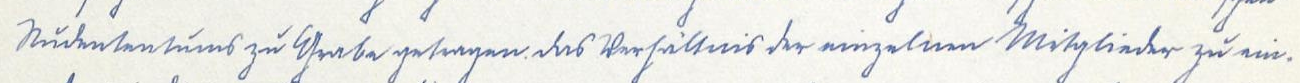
Studententums zu Grabe getragen. Das Verhältnis der einzelnen Mitglieder zuein-
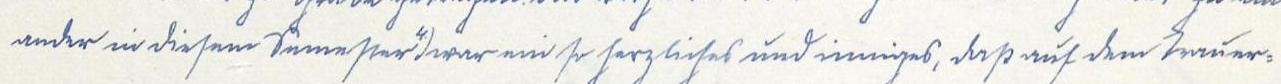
ander in diesem Semester 4) war ein so herzliches und inniges, daß auf dem Trauer-
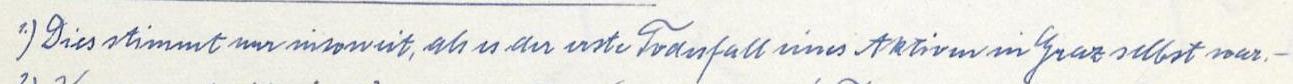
1) Dies stimmt nur insoweit, dass es der erste Traufall eines Aktiven in Graz selbst war.-
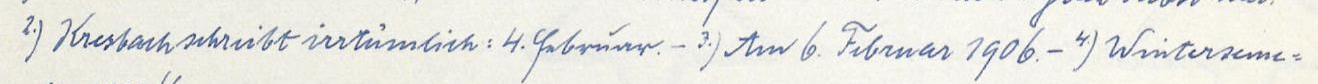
2) Kresbach schreibt irrtümlich: 4. Februar.- 3) Am 6. Februar 1906.- 4) Winterseme-
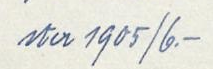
ster 1905/6.
